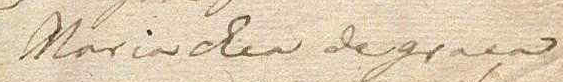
Maria chea de graça
